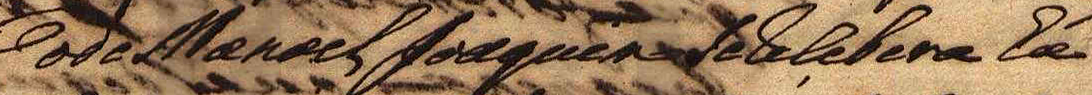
o de Manoel Joaquim se Reçebera há
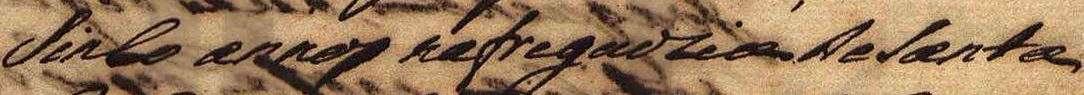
sinCo annos na freguezia de Santa
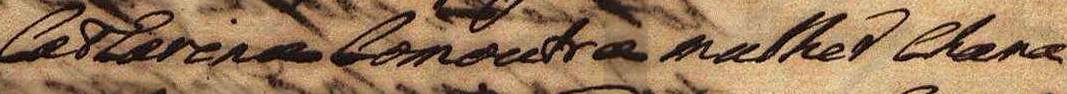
Catharina Com outra mulher Chama
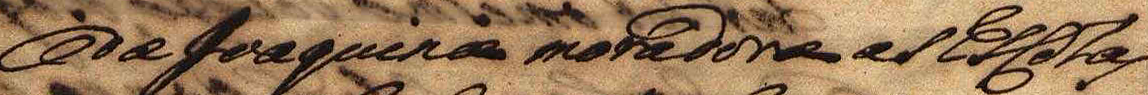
da Joaquina moradora as EsColas
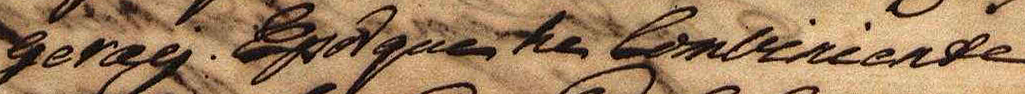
geraes. E porque he Coviniente
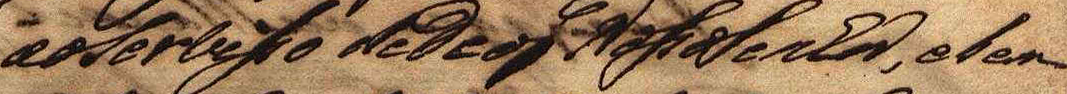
ao Servisso de Deos Nosso Senhor, e bem
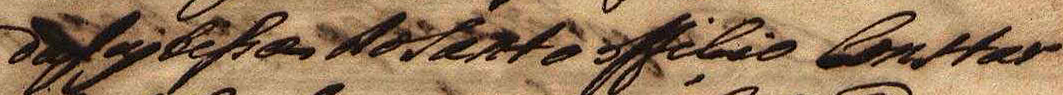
da Justissa do santo offiÇio Constar
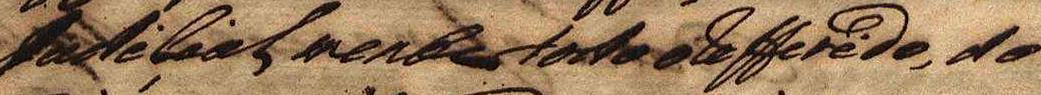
JudeÇialmente todo o Refferido, do
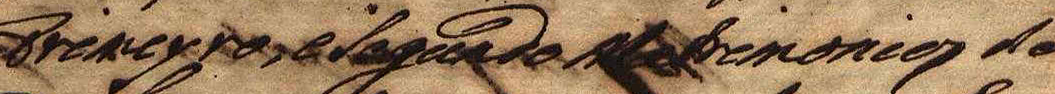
Primeyro, e segundo Matrimonios do
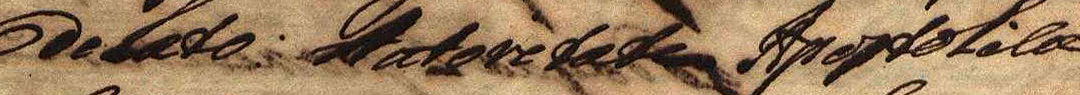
deLato: Autoretate ApostoLica
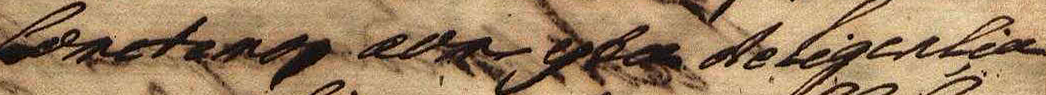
Cometemos a vm esta deLigenÇia
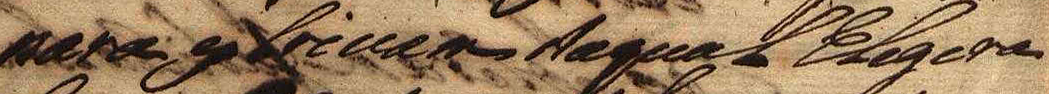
para esCriuam da qual Elegera
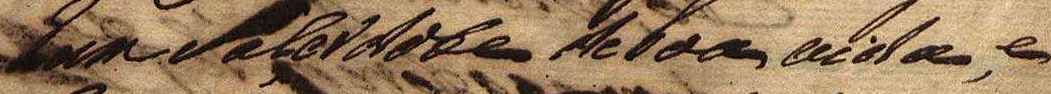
hum SaÇerdote de boa vida, e
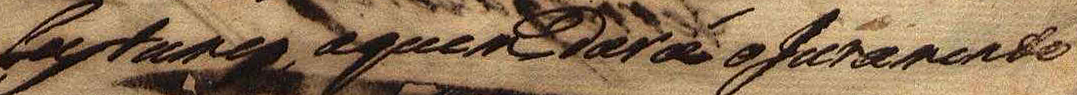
Custumes, a quem dará o Juramento
